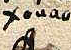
xouaõ
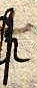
R.
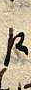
R
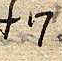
f 17
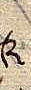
R.
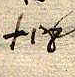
f 18
